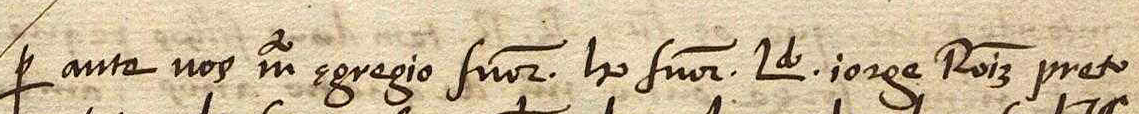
ꝑante uos mto Egregio snōr. ho snōr. Ldo. iorge Rōiz preto
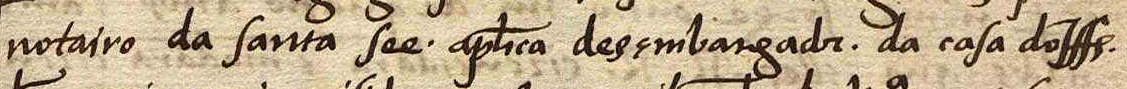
notairo da santa see. ap̄lica desEmbargador. da casa do Jffꝭ.
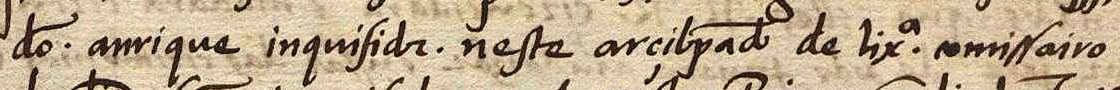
dō. anrique inquisidor. neste arçibp̄ado de lixa. comissairo
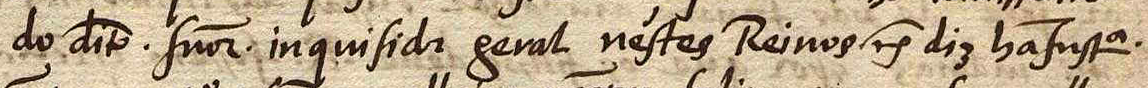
do dito . snōr. inquisidor geral nestes Reinos c̄ꝭ diz ha Justa.
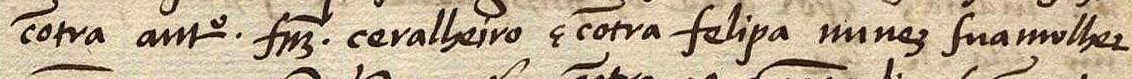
c̄otra anto. frr̄z. çeralheiro E c̄otra felipa nunez sua molher
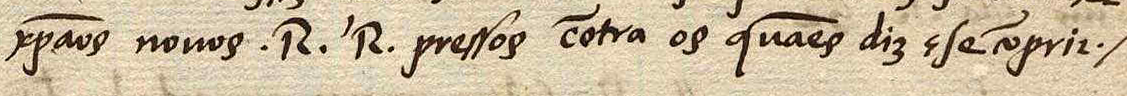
xpãos nouos .R. R. pressos c̄otra os qūaes diz E se c̄oprir./
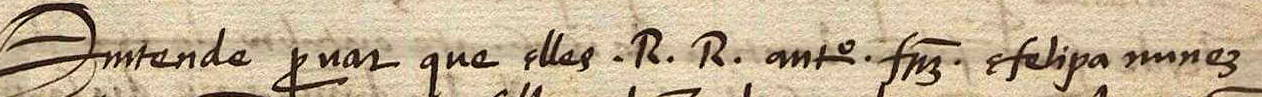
Emtende ꝓuar que elles .R. R. anto. fr̄rz . E felipa nunez
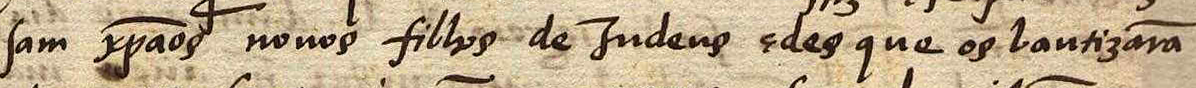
sam xpãos nouos filhos de Judeus E des que os bautizāra
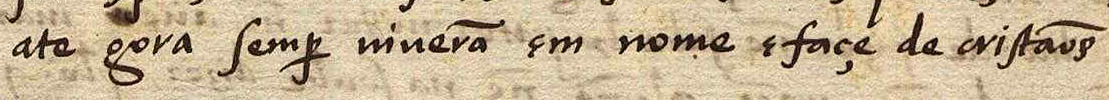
ate gora semꝑ uiuer̄a Em nome E façe de cristãos
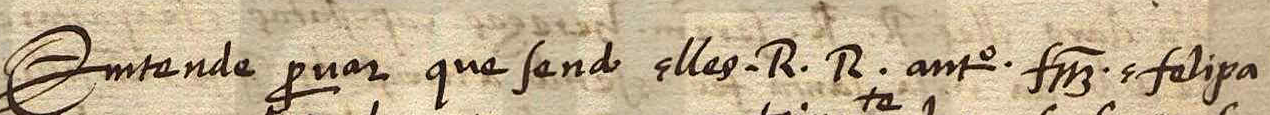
Emtende ꝓuar que sendo Elles .R.R. anto. fr̄rz. E felipa
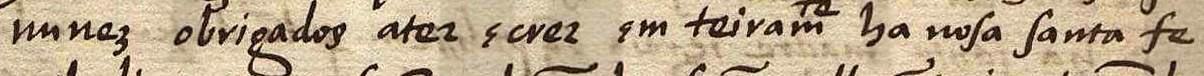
nunez obrigados a ter E crer Em teiramte ha nosa santa fe
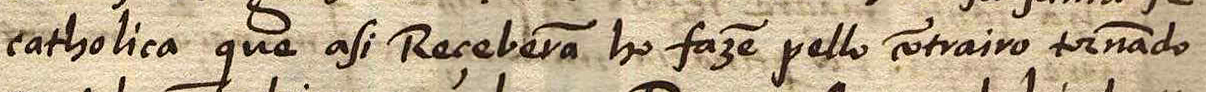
catholica que asi Reçeber̄a ho faz̄e pello c̄otrairo torn̄ado
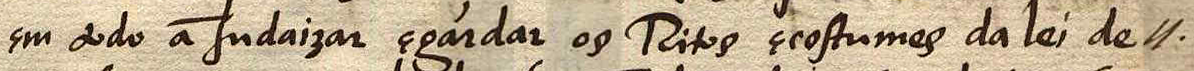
Em todo a Judaizar E gardar os Ritos E costumes da lei de //.
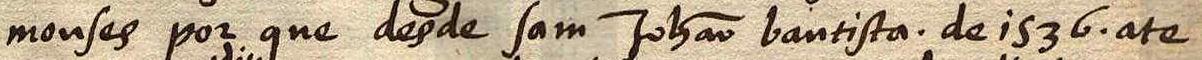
mouses por que desde sam Johão bautista. de i536. ate
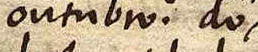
outubro. do
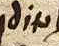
dito
